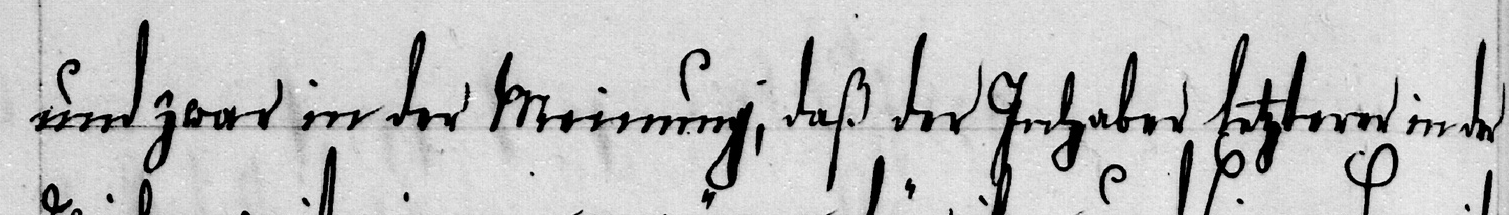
und zwar in der Meinung, daß der Inhaber letzterer in
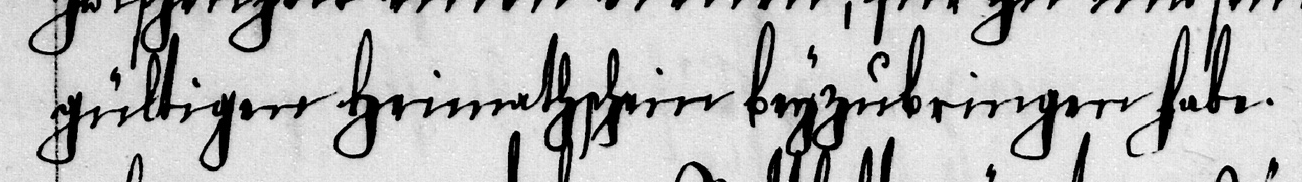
gültigen Heimathschein beyzubringen habe.
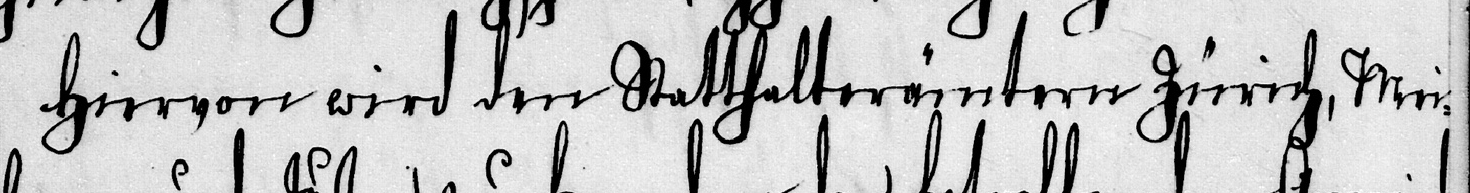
Hiervon wird den Statthalterämtern Zürich, Mei¬
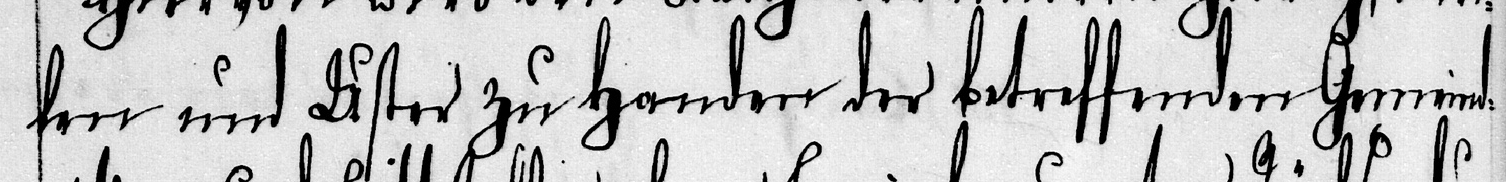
len und Uster zu Handen der betreffenden Gemein¬
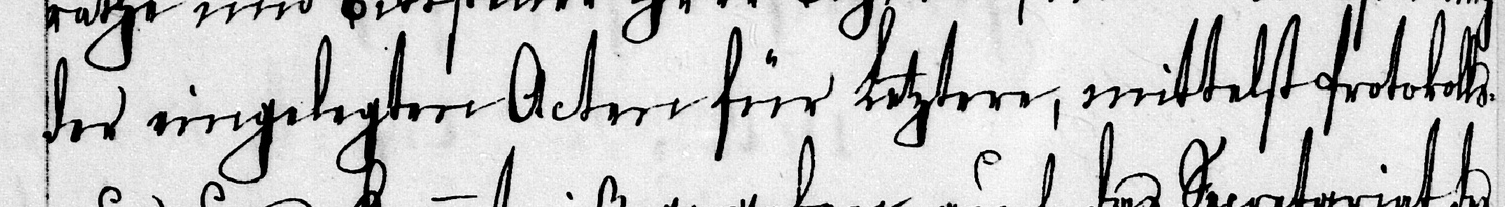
der eingelegten Acten für Letztere, mittelst Protokol¬
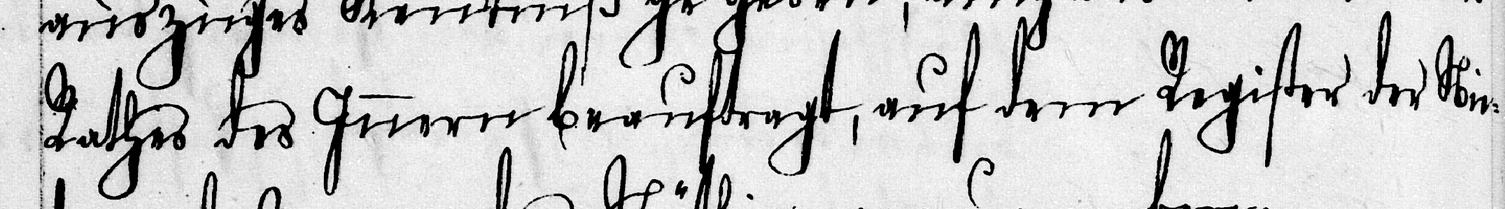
Rathes des Innern beauftragt, auf dem Register der Ni¬
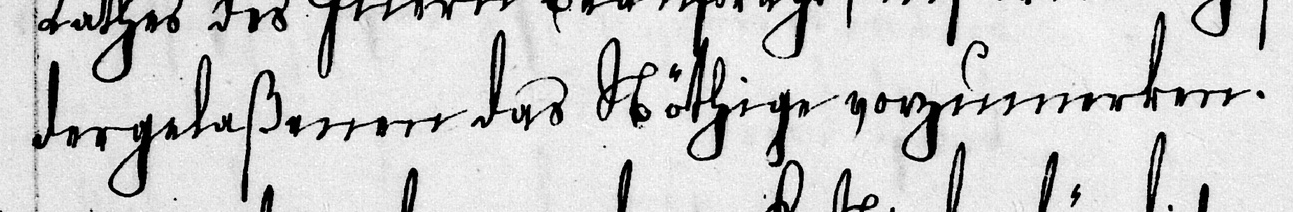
edergelaßenen das Nöthige vorzumerken.
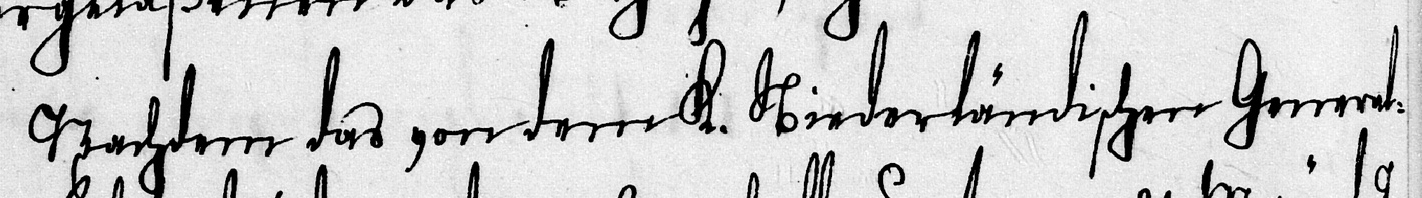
Nachdem das von dem K. Niederländischen Genera¬
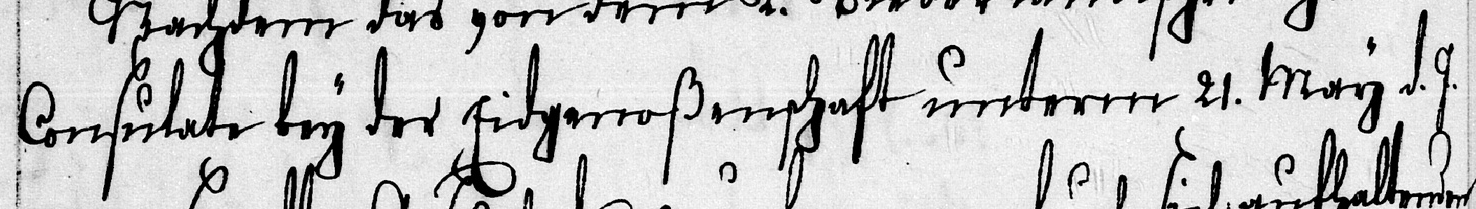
nsulate bey der Eidgenoßenschaft unterm 21. May d.
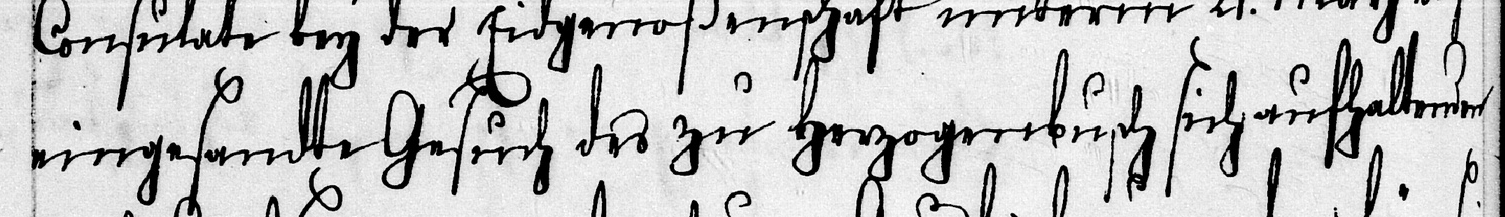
eingesandte Gesuch das zu Herzogenbusch sich aufhalten¬
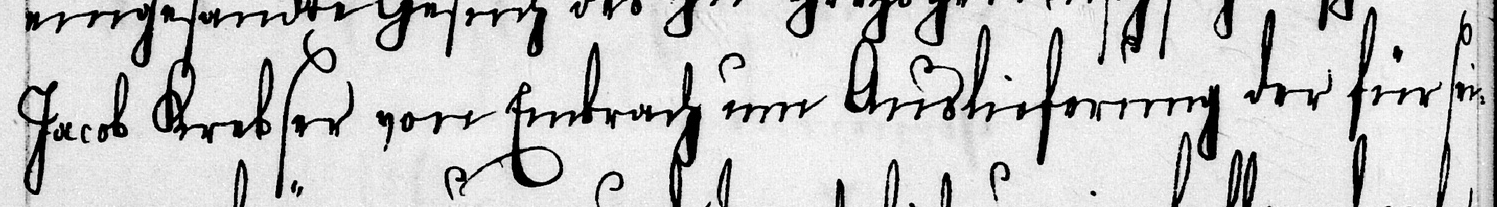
Jacob Krebser von Embrach um Auslieferung der für s¬
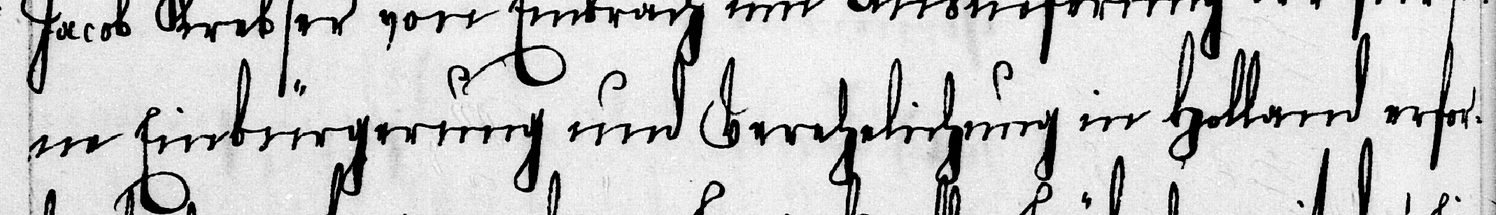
eine Einbürgerung und Verehelichung in Holland erfo¬
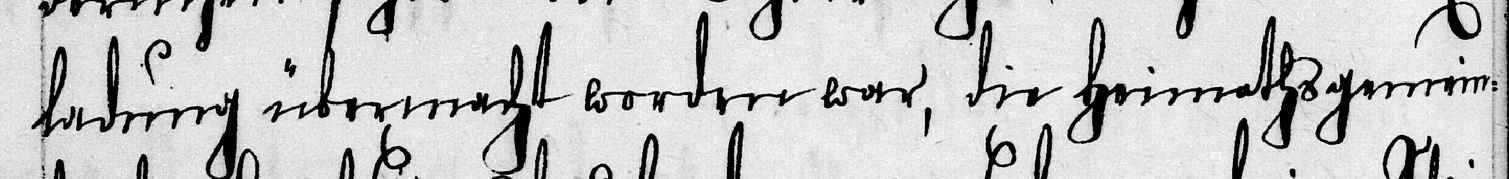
nladung übermacht worden war, die Heimathsgemein¬
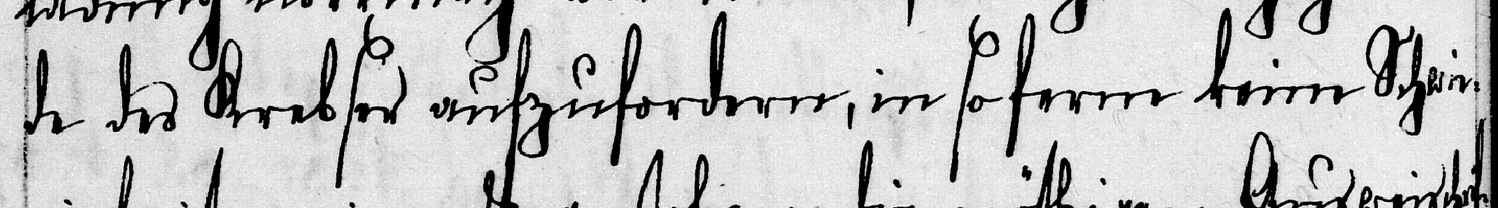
de des Krebser aufzufordern, in so ferne keine Schwi¬
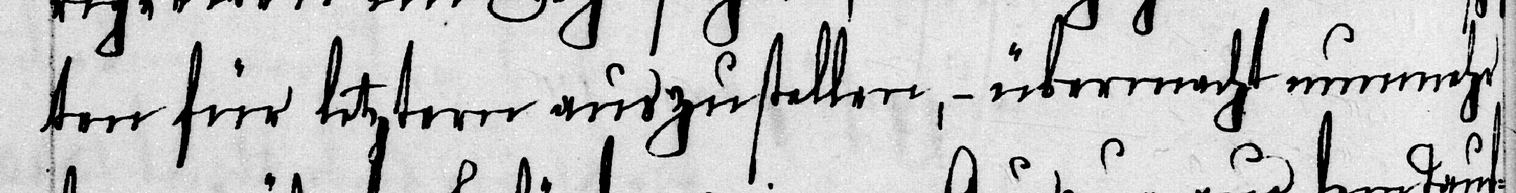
ften für letztern auszustellen, - übermacht nunmehr
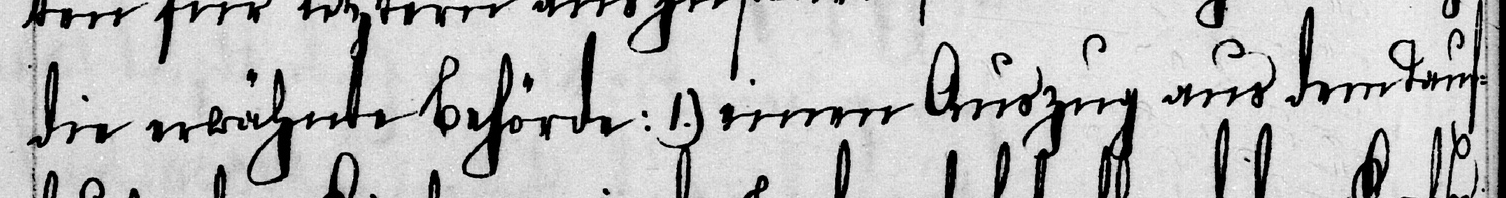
die erwähnte Behörde: 1.) einen Auszug aus dem Tauf¬
